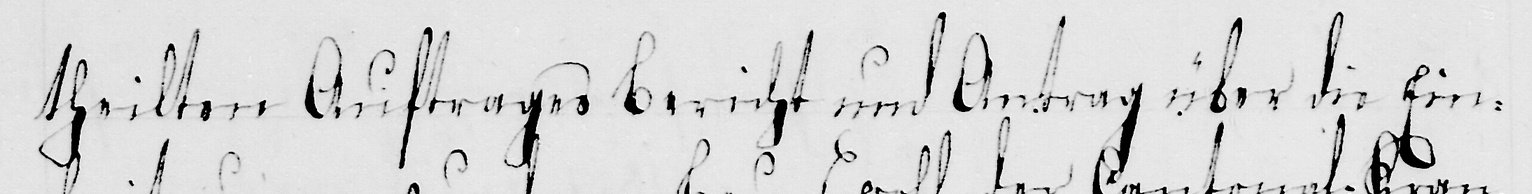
theilten Auftrages Bericht und Antrag über die Ein¬
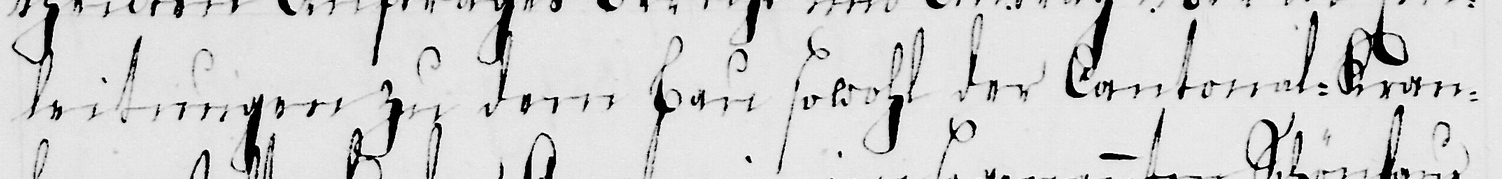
leitungen zu dem Bau sowohl der Cantonal-Kran¬
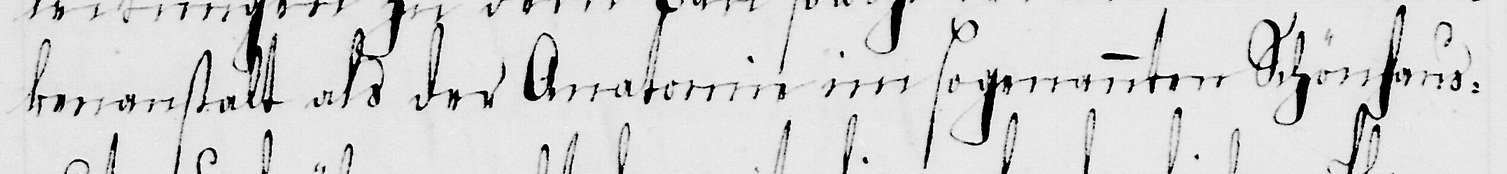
kenanstalt als der Anatomie im sogenannten Schönhaus¬
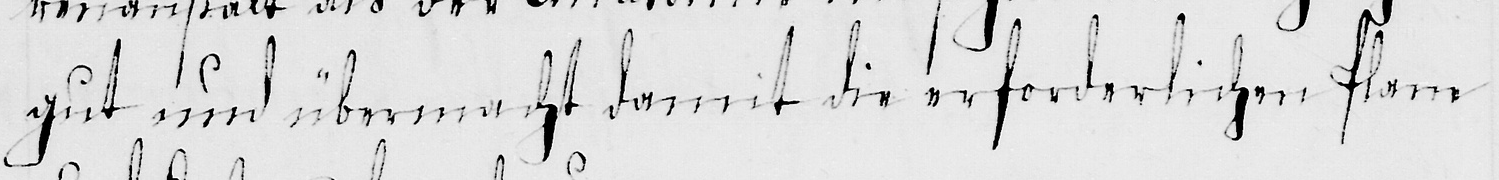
gut und übermacht damit die erforderlichen Plane
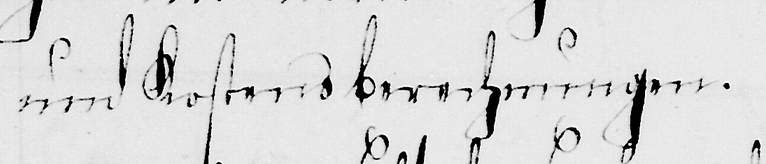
und Kostensberechnungen.
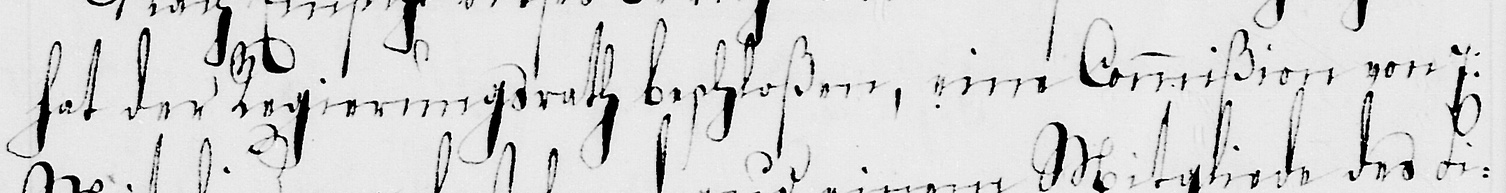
hat der Regierungsrath beschloßen, eine Commißion von 7:
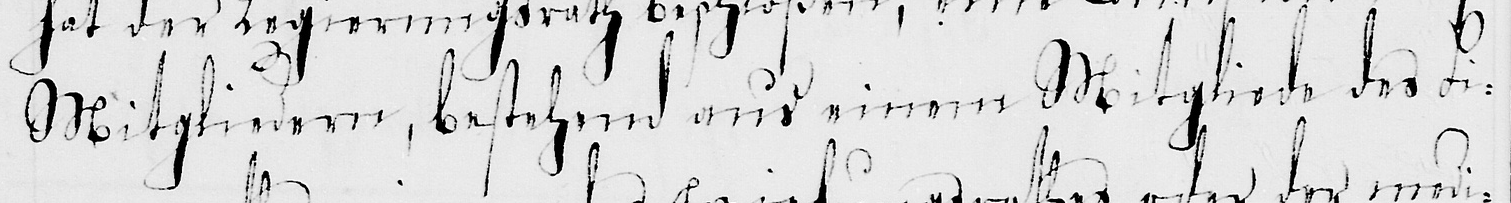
Mitgliedern, bestehend aus einem Mitgliede des Fi¬
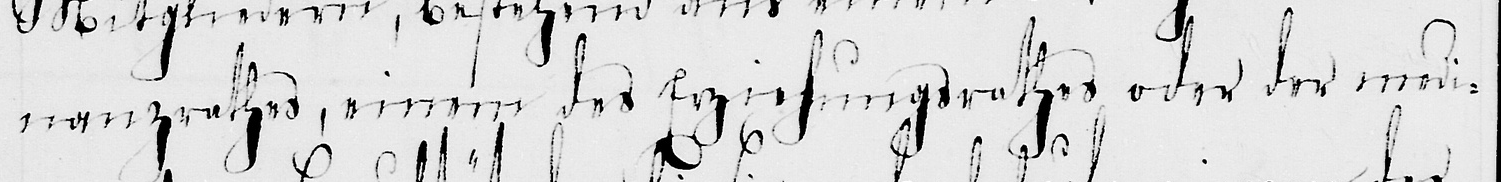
nanzrathes, einem des Erziehungsrathes oder der medi¬
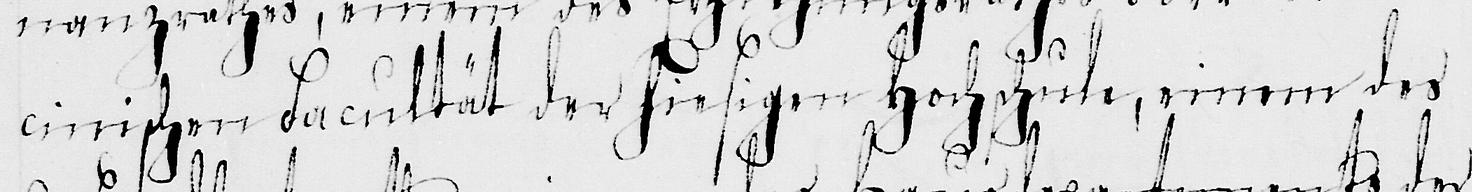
cinischen Facultät der hiesigen Hochschule, einem des
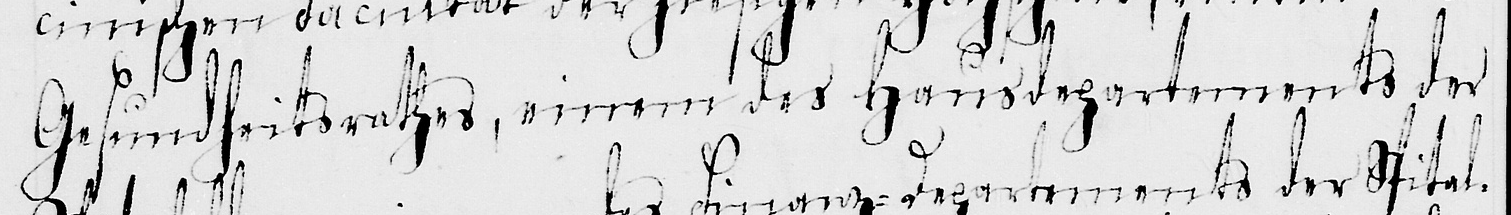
Gesundheitsrathes, einem des Hausdepartements der
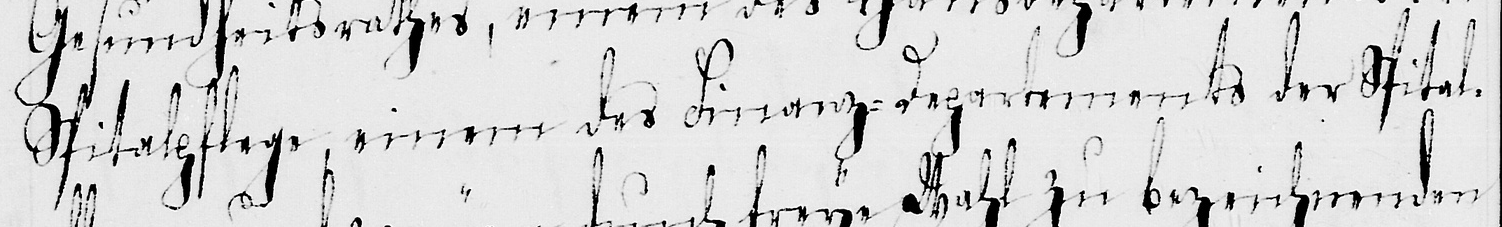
Spitalpflege, einem des Finanz-Departements der Spital¬
